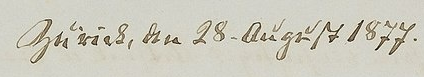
Zürich, den 28. August 1877.
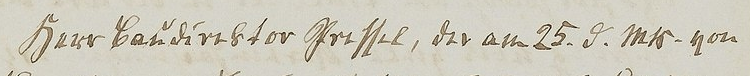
Herr Baudirektor Pressel, der am 25. d. Mts. von
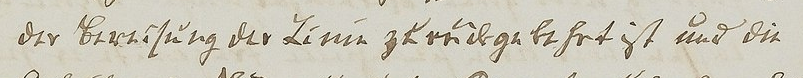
der Bereisung der Linie zurückgekehrt ist und die
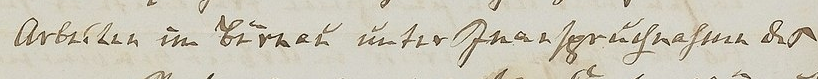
Arbeiten im Bureau unter Inanspruchnahme des
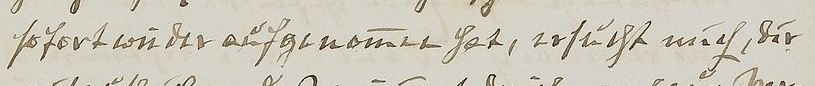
sofort wieder aufgenommen hat, ersucht mich, Dir
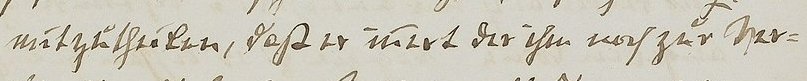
mitzutheilen, daß er innert der ihm noch zur Ver-
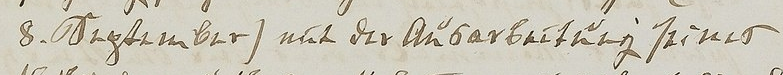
8. September) mit der Ausarbeitung seines
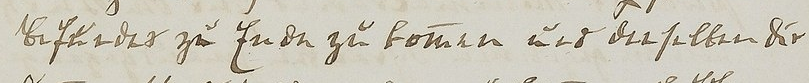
Befundes zu Ende zu kommen und denselben Dir
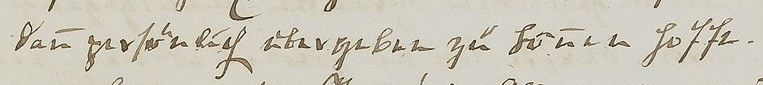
dann persönlich übergeben zu können hoffe.
